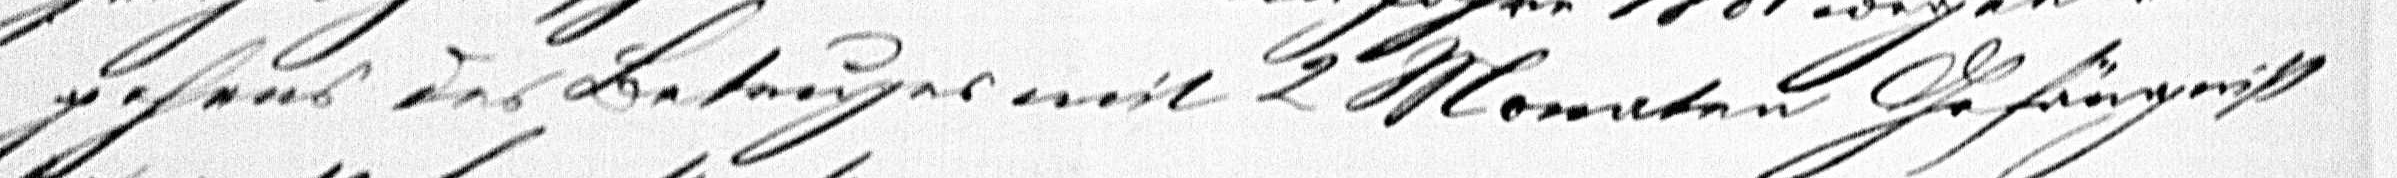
gehens des Betruges mit 2 Monaten Gefängniß
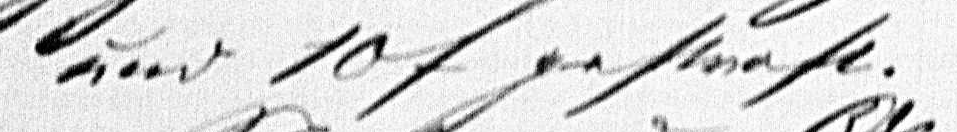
und 10f gestraft.
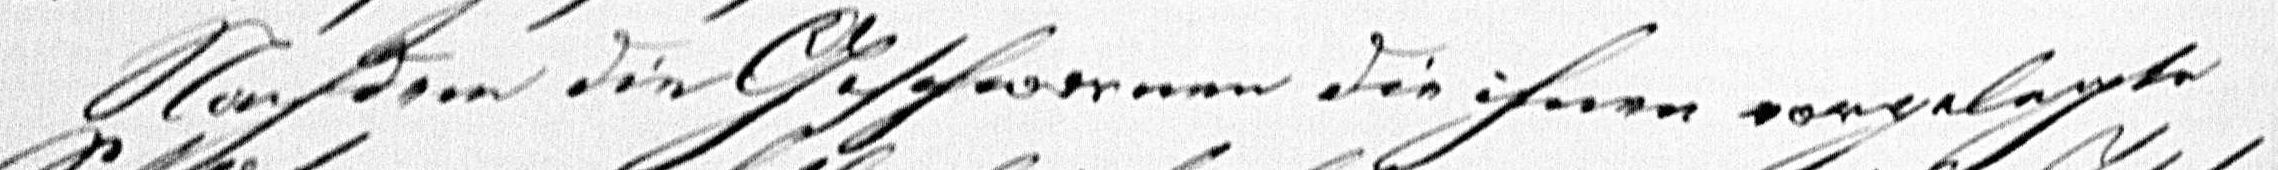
Nachdem die Geschworenen die ihnen vorgelegte
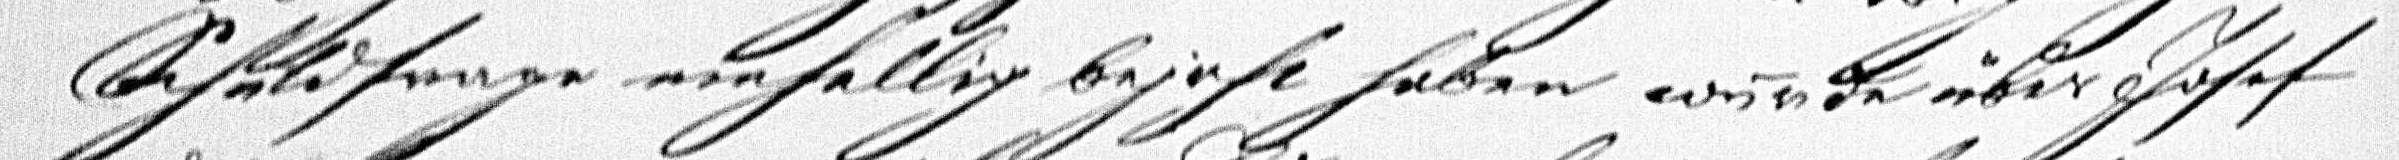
Schuldfrage einhellig bejaht haben wurde über Josef
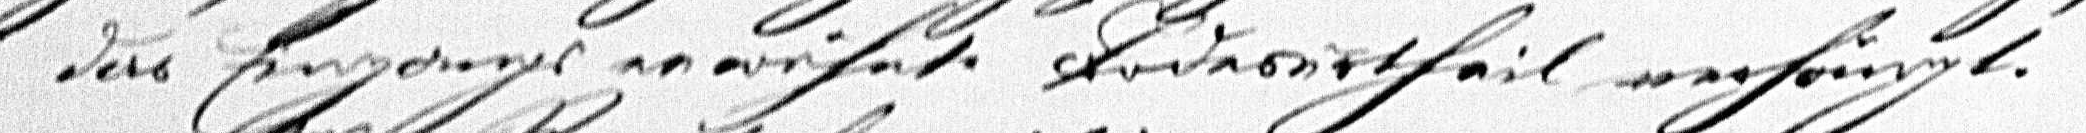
das Eingangs erwähnte Todesurtheil verhängt.
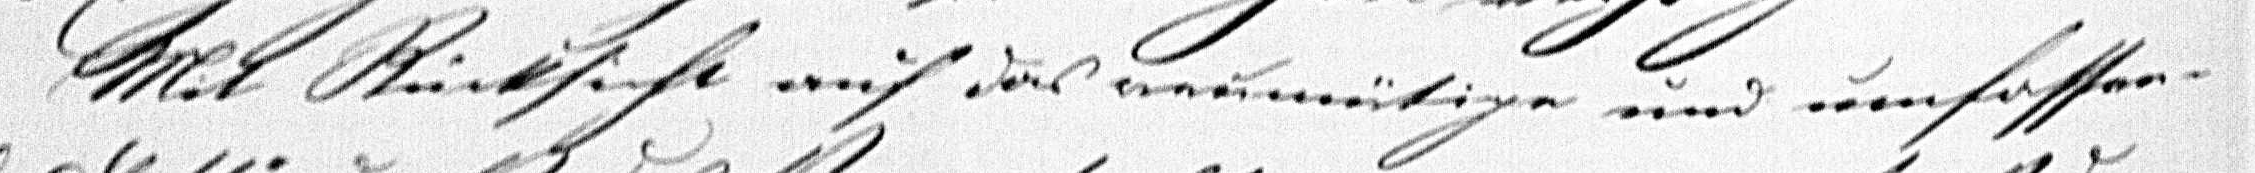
Mit Rücksicht auf das reumütige und umfassen¬
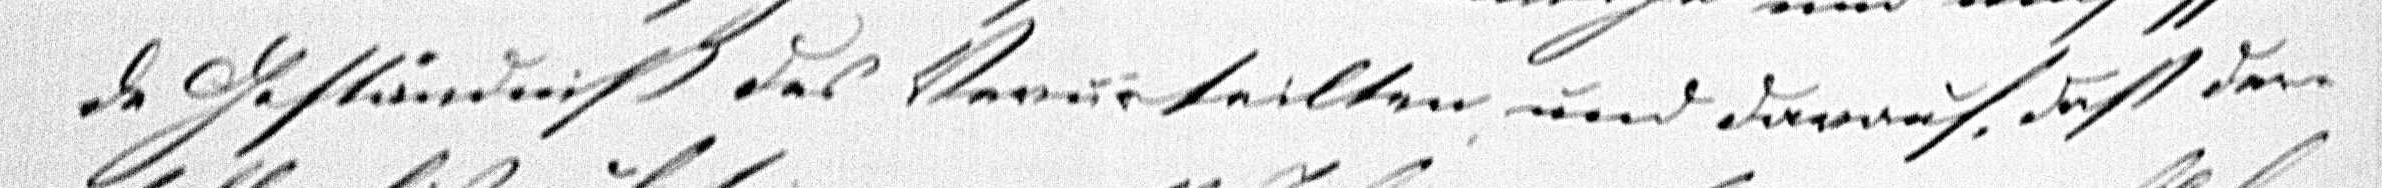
de Geständniß das Verurtheilten und darauf, daß der¬
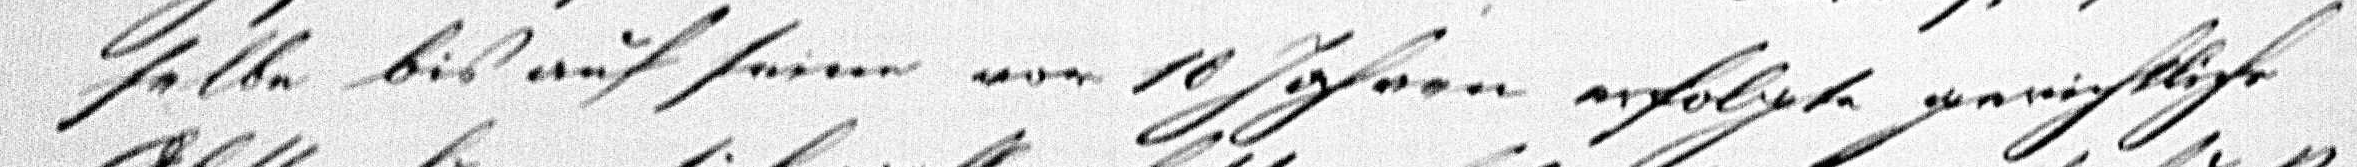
selbe bis auf seine vor 10 Jahren erfolgte gerichtliche
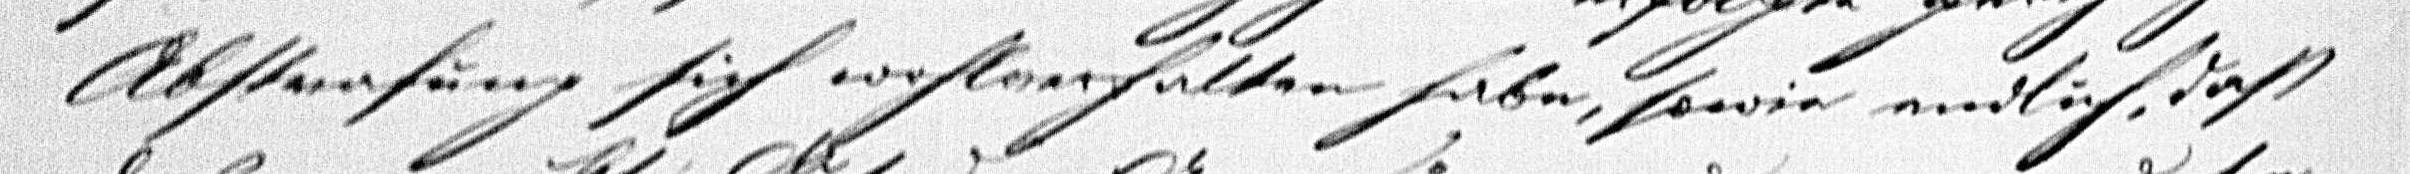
Abstrafung sich wohlverhalten habe, sowie endlich, daß
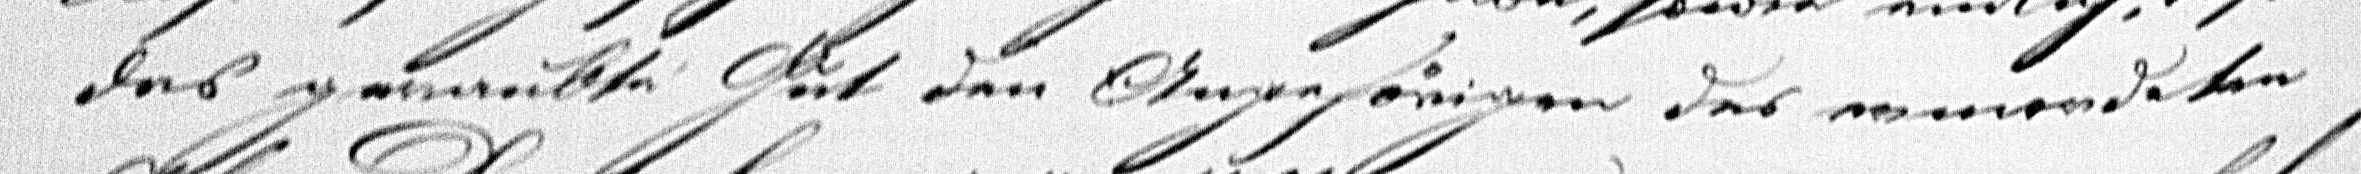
das geraubte Gut den Angehörigen des ermordeten
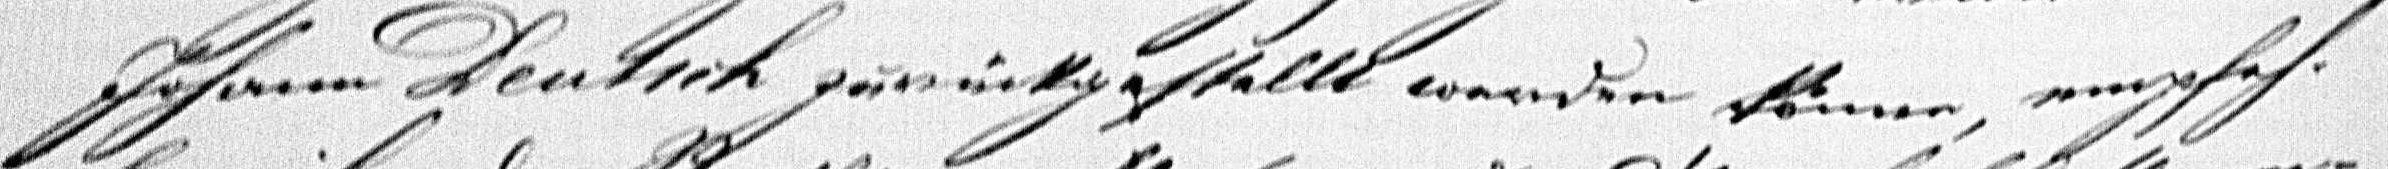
Johann Deutsch zurückgestellt werden könne, empfeh¬
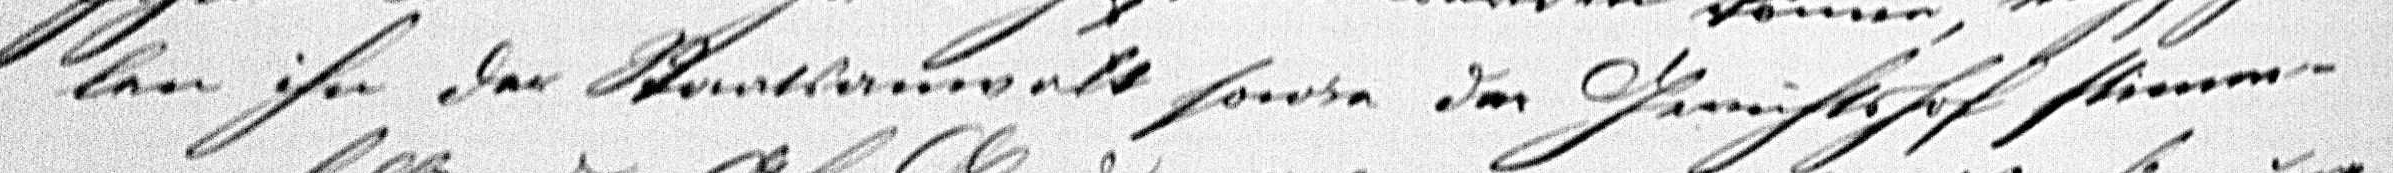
len ihn der Staatsanwalt sowie der Gerichtshof stimm¬
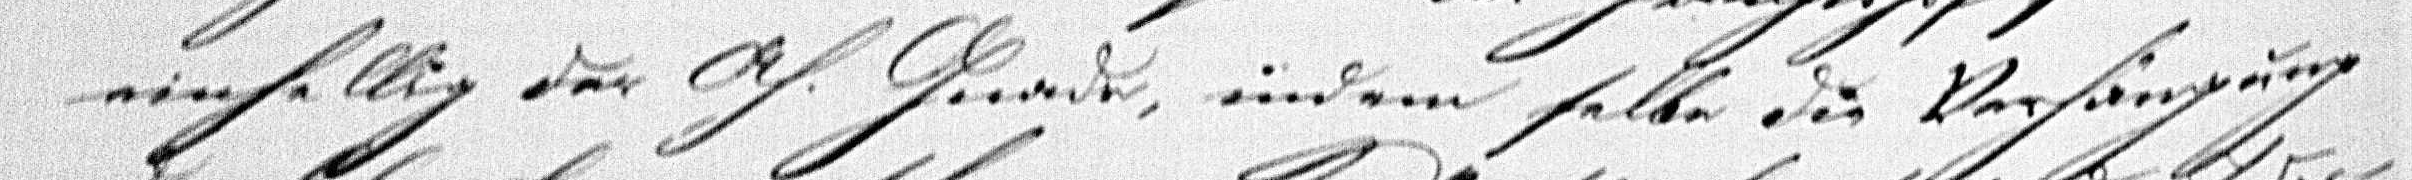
einhellig der Ah Gnade, indem selbe die Verhängung
